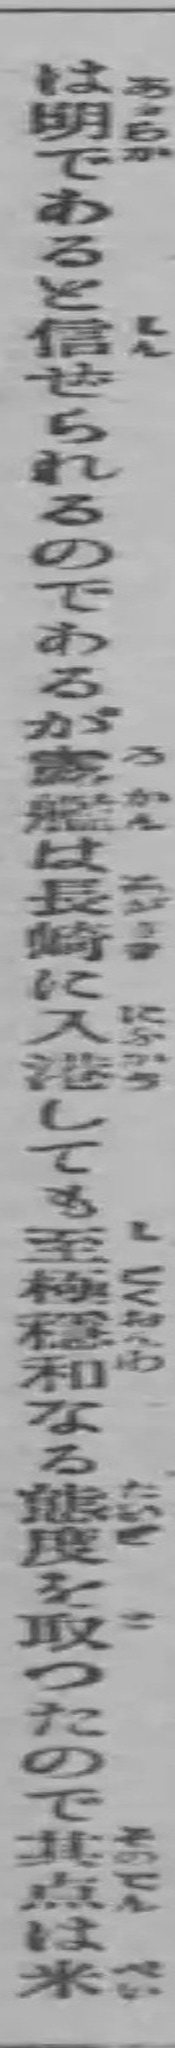は明であると信ぜられるのであるが露艦は長崎に入港しても至極穏和なる態度を取つたので其点は米
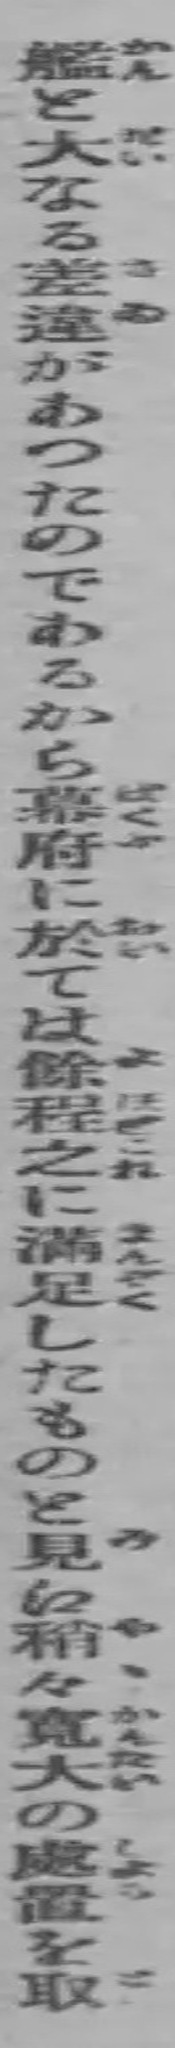艦と大なる差違があつたのであるから幕府に於ては余程之に満足したものと見え稍々寛大の処置を取

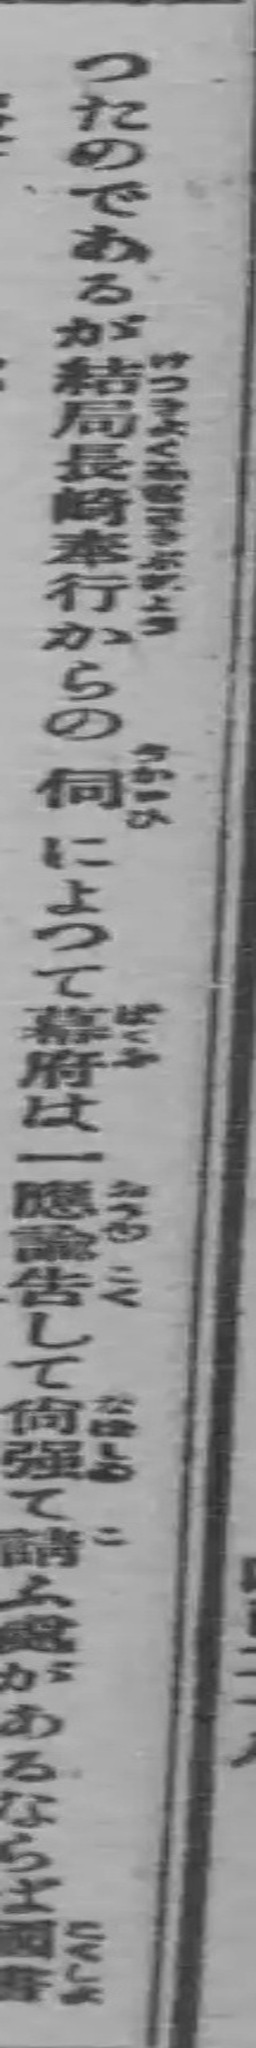つたのであるが結局長崎奉行からの伺によつて幕府は一応諭告して尚強て請ふ処があるならば国書
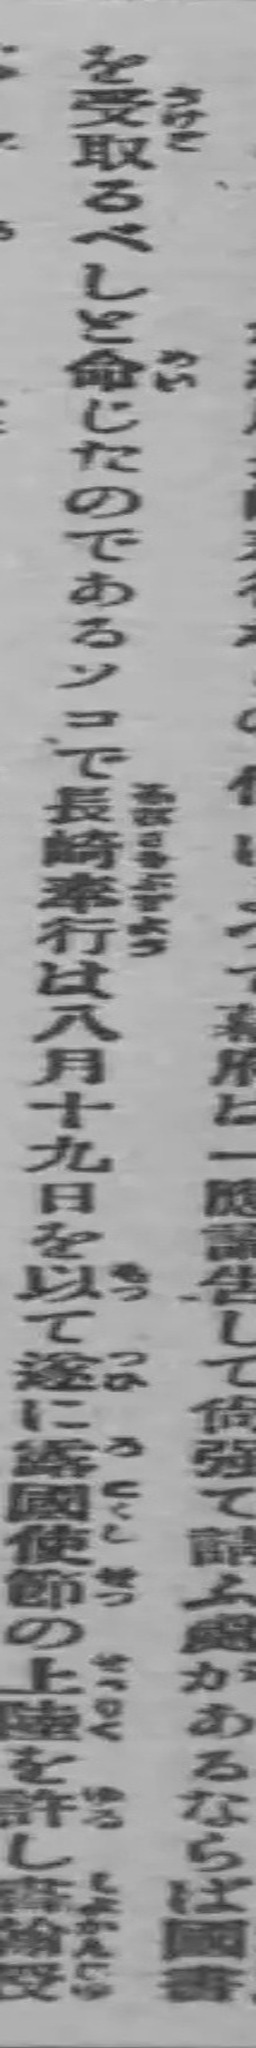を受取るべしと命じたのであるソコで長崎奉行は八月十九日を以て遂に露国使節の上陸を許し書翰授
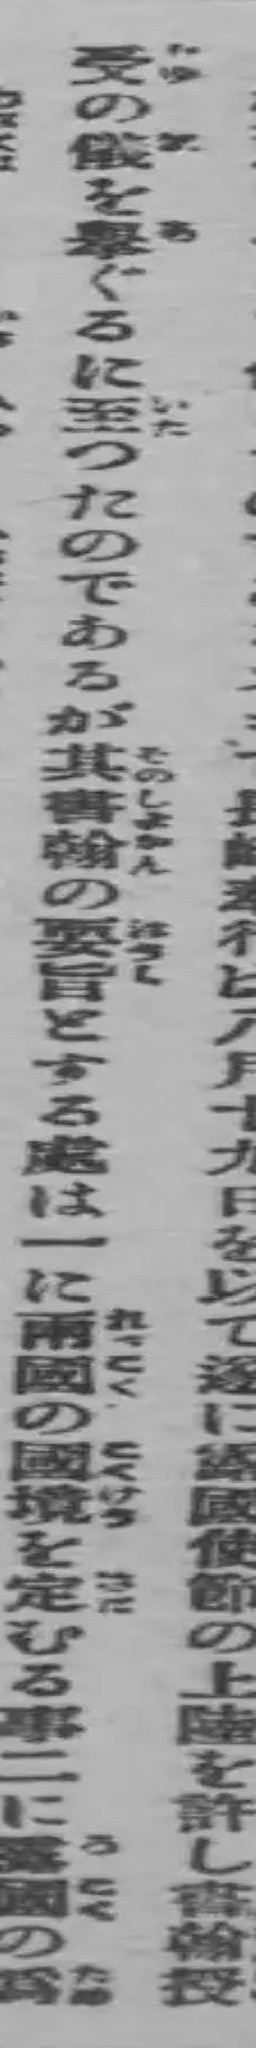受の儀を挙ぐるに至つたのであるが其書翰の要旨とする処は一に両国の国境を定むる事二に露国の為
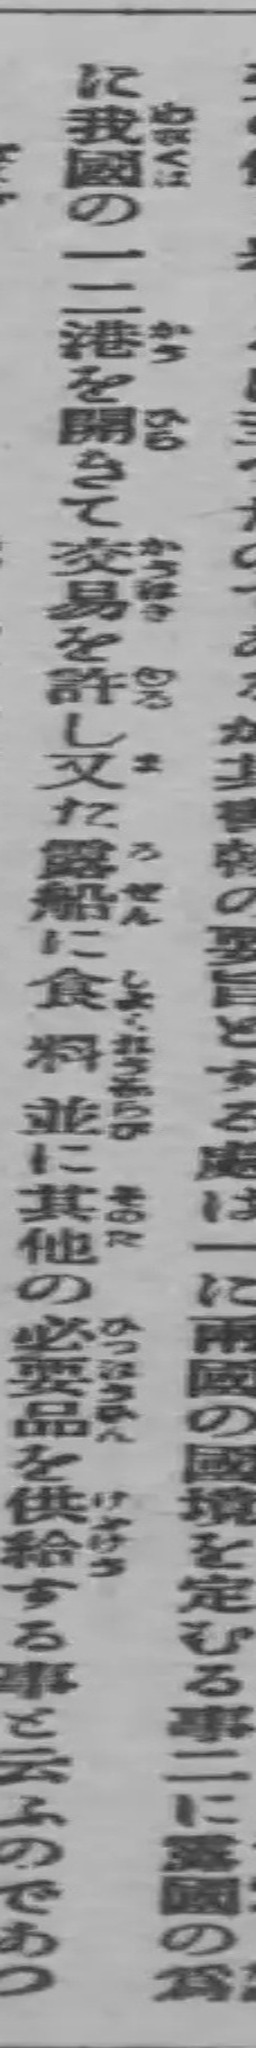に我国の一二港を開きて交易を許し又た露船に食料並に其他の必要品を供給する事と云ふのであつ
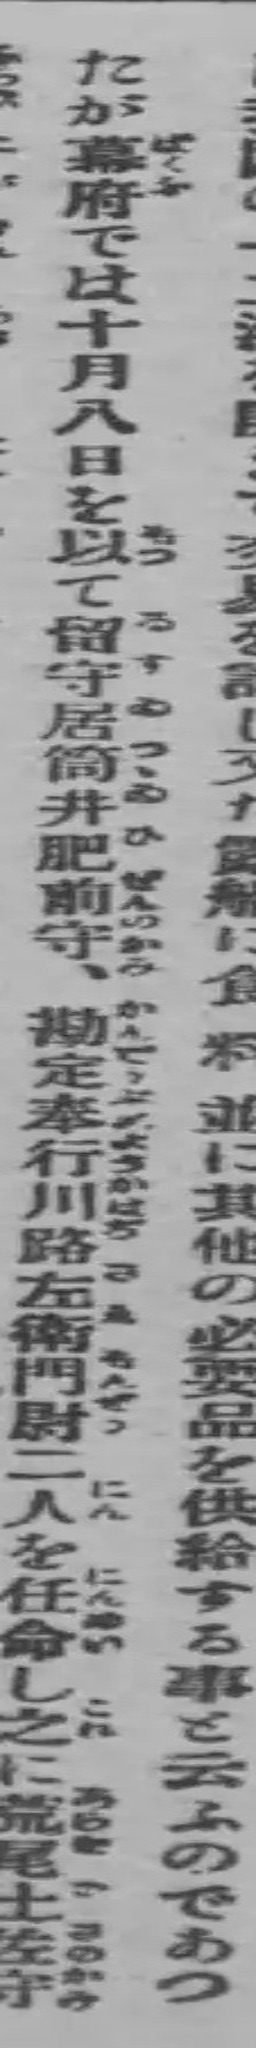たが幕府では十月八日を以て留守居筒井肥前守、勘定奉行川路左衛門尉二人を任命し之に荒尾土佐守
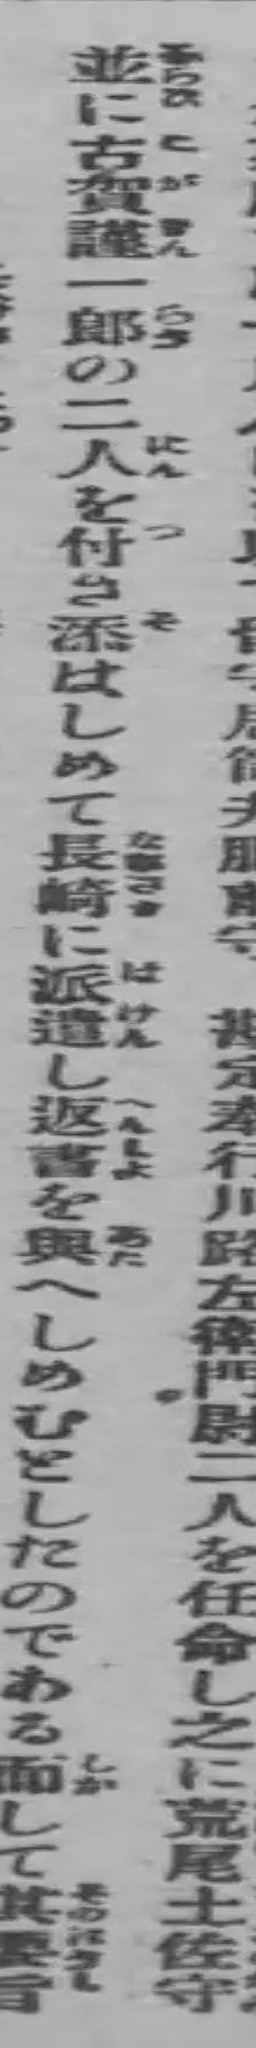並に古賀謹一郎の二人を付き添はしめて長崎に派遣し返書を与へしめむとしたのである而して其要旨
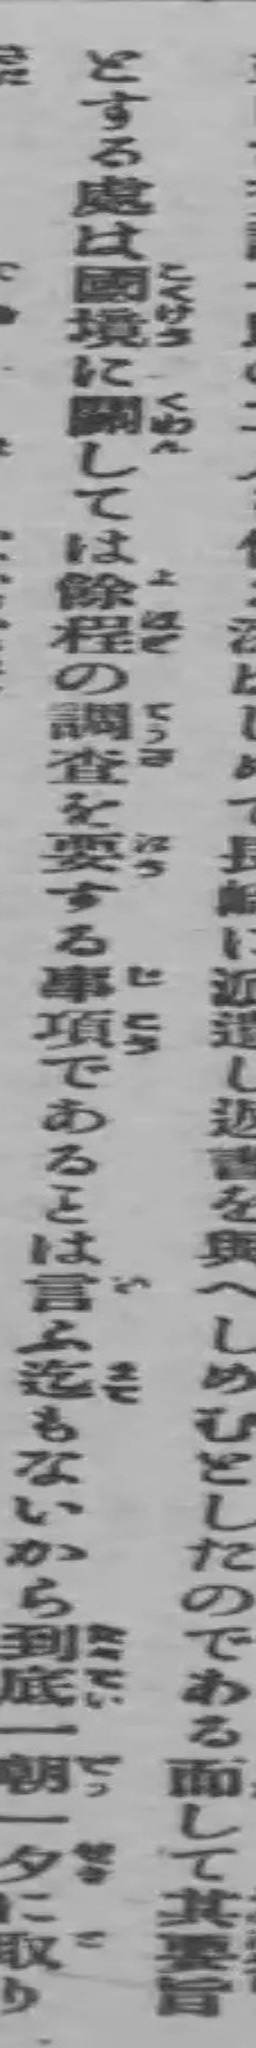とする処は国境に関しては余程の調査を要する事項であることは言ふ迄もないから到底一朝一夕に取り
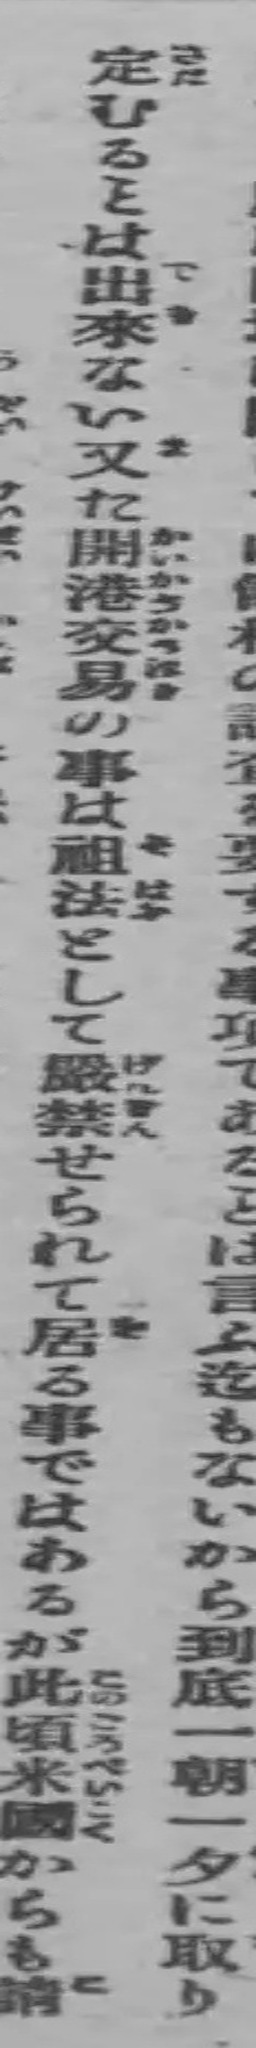定むることは出来ない又た開港交易の事は祖法として厳禁せられて居る事ではあるが此頃米国からも請
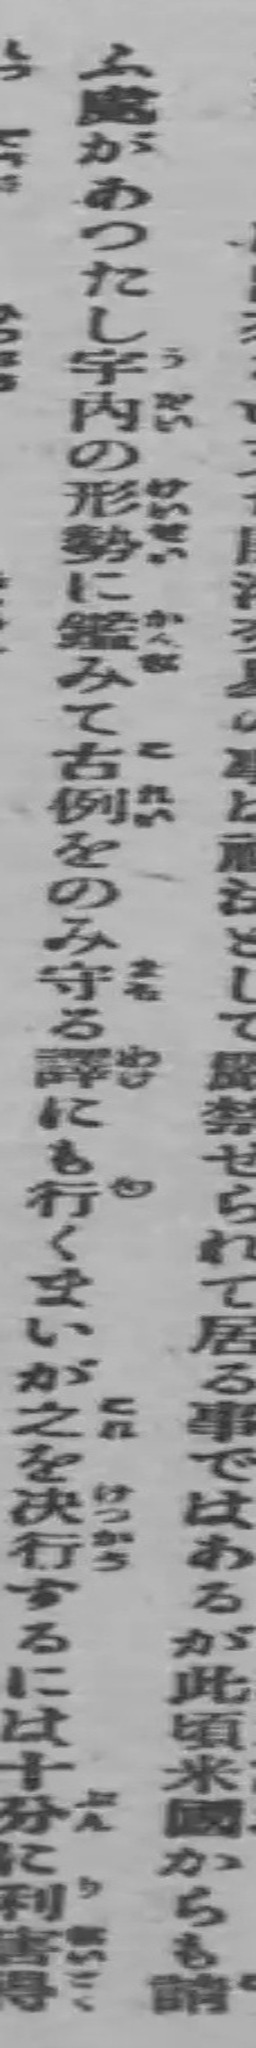ふ処があつたし宇内の形勢に鑑みて古例をのみ守る訳にも行くまいが之を決行するには十分に利害得
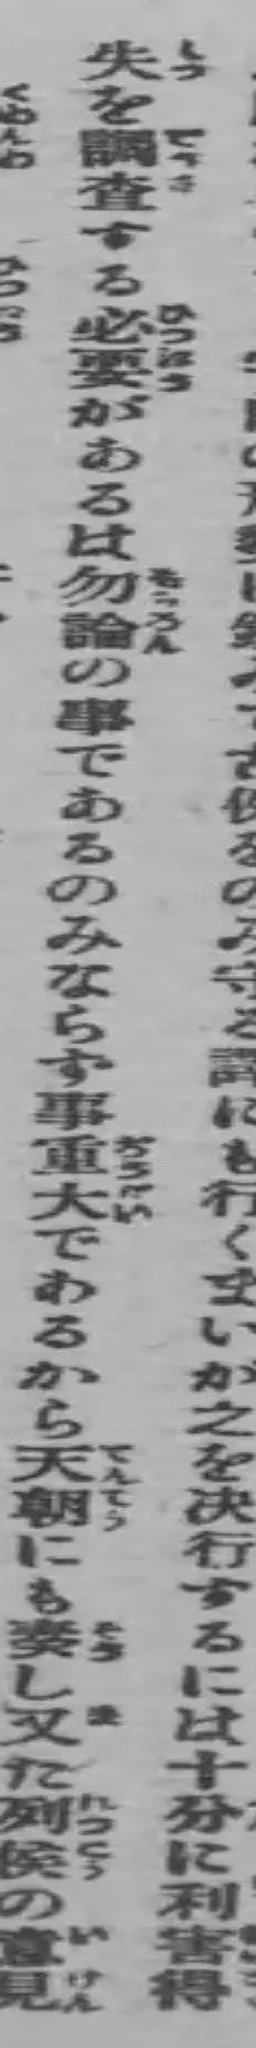失を調査する必要があるは勿論の事であるのみならず事重大であるから天朝にも奏し又た列侯の意見
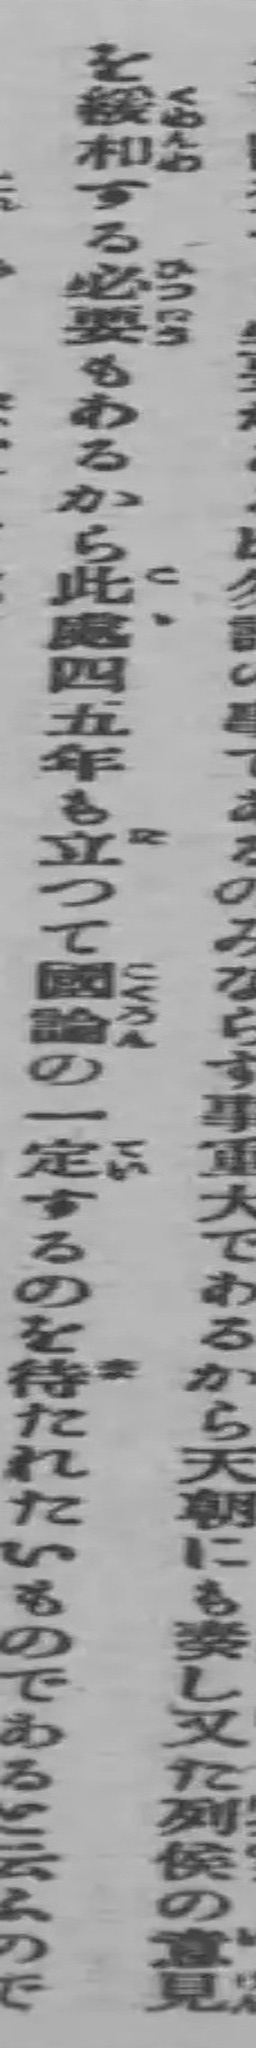を緩和する必要もあるから此処四五年も立つて国論の一定するのを待たれたいものであると云ふので
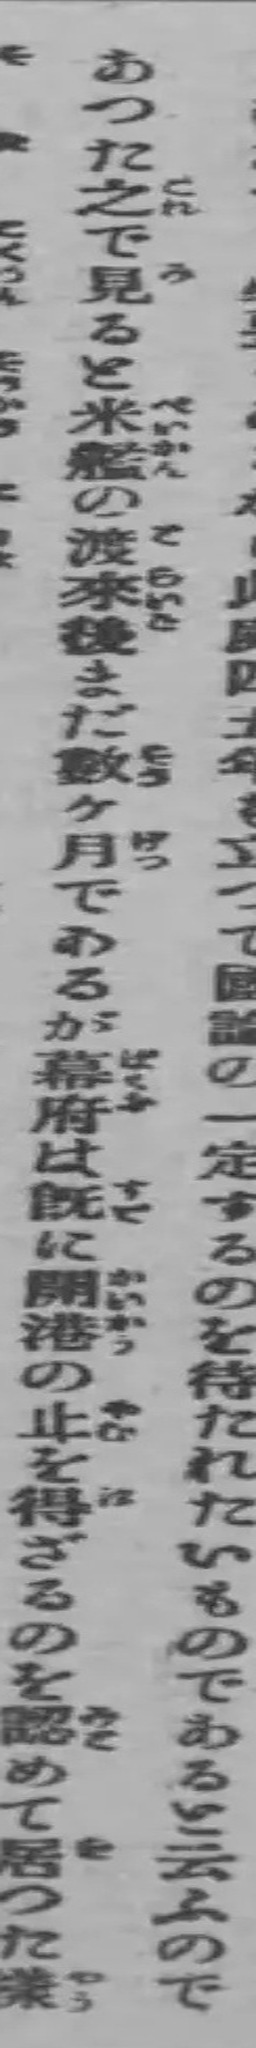あつた之で見ると米艦の渡来後まだ数ヶ月であるが幕府は既に開港の止を得ざるのを認めて居つた様
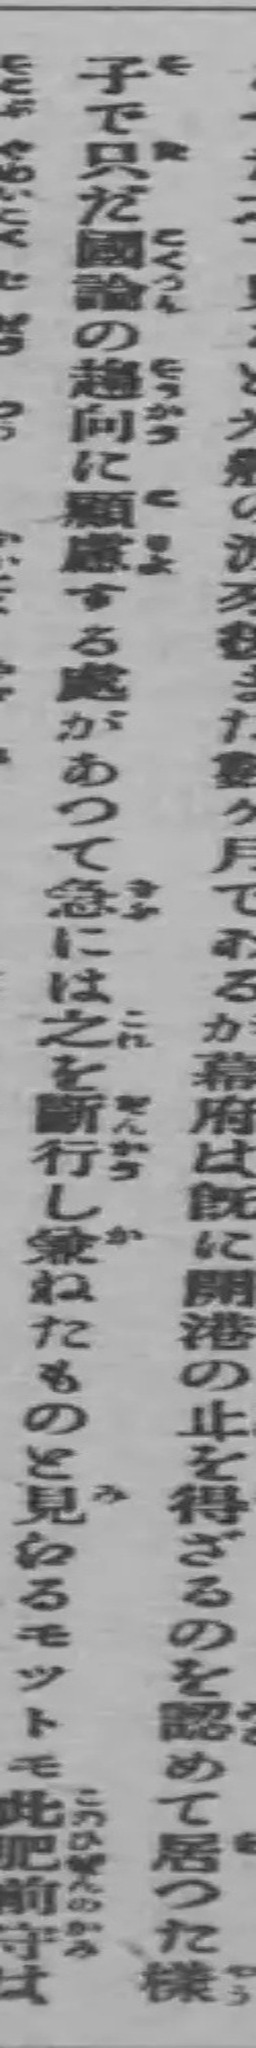子で只だ国論の趨向に顧慮する処があつて急には之を断行し兼ねたものと見えるモツトモ此肥前守は
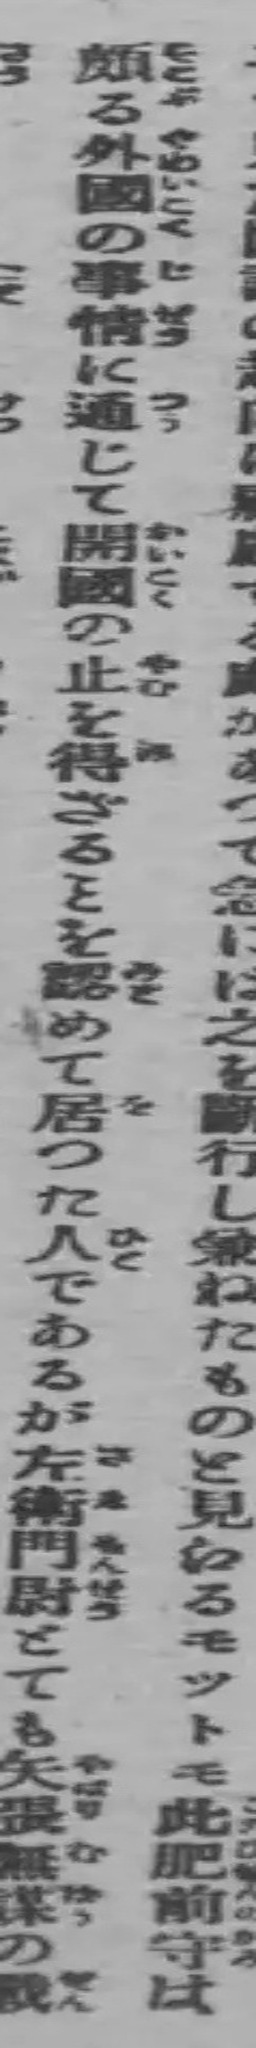頗る外国の事情に通じて開国の止を得ざることを認めて居つた人であるが左衛門尉とても矢張無謀の戦
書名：豊橋市史談
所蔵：国立国会図書館 National Diet Library, JAPAN
